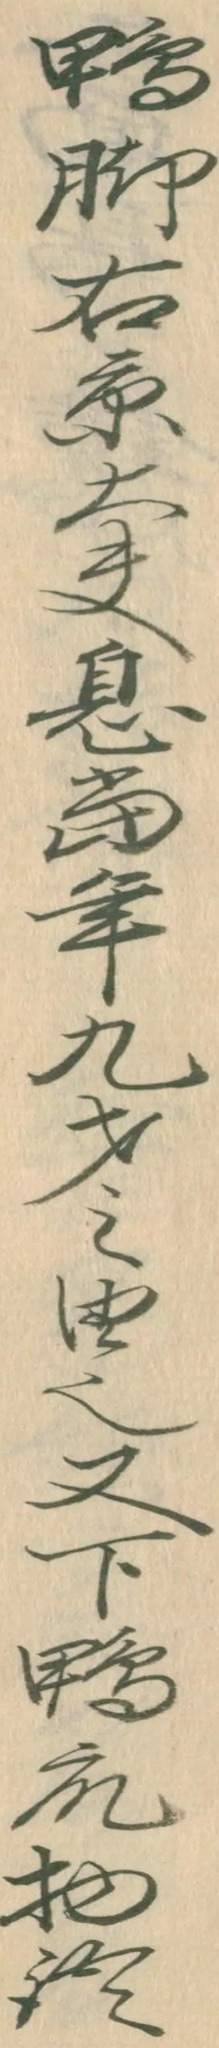鴨卿右京大夫息当年九才之由也又下鴨衆物語
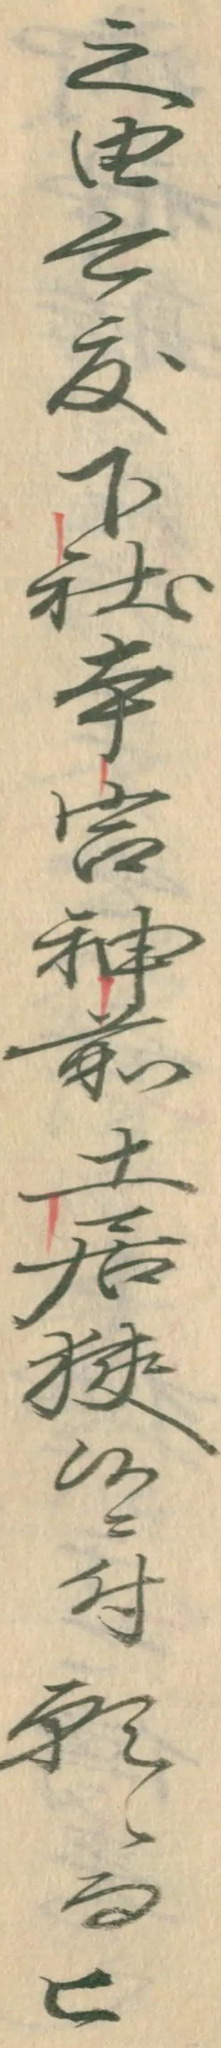之由今度下_社本-宮神-前土_居狭候ニ付願候而ヒ
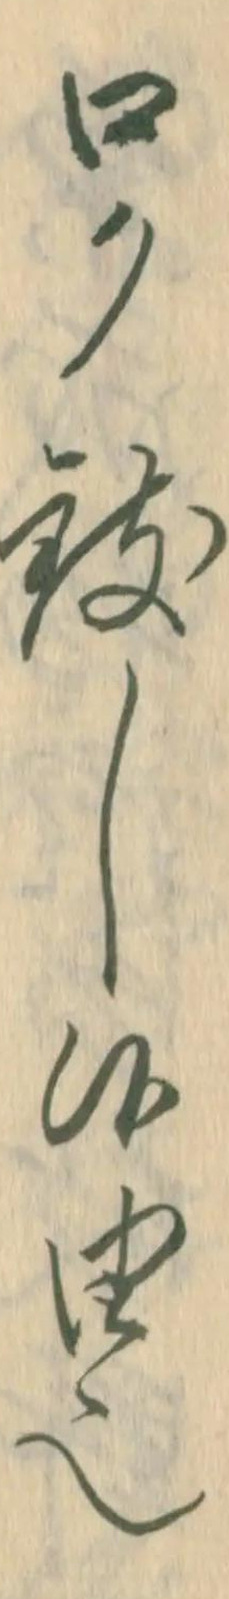口ク致し候由也

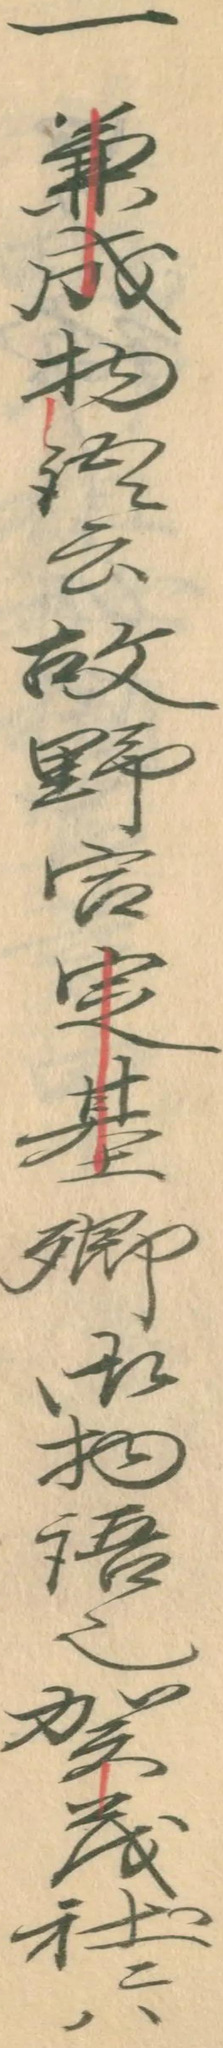一兼成物_語云故野宮定基卿御物語也賀-茂社ニハ
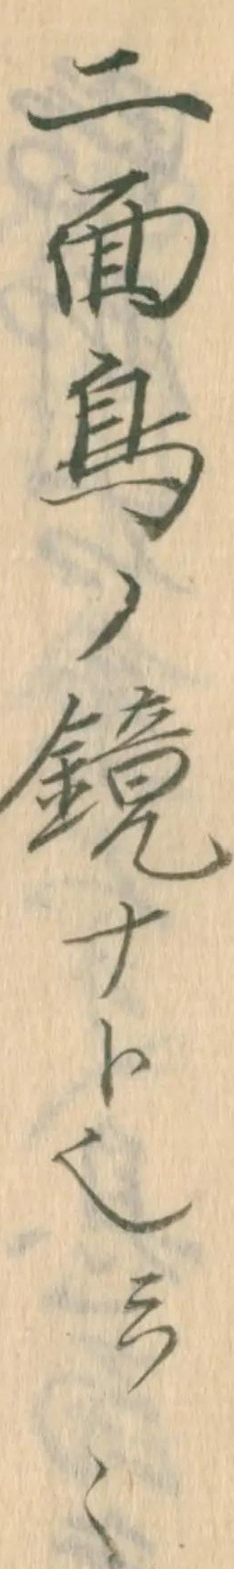二面鳥ノ鏡ナト也云々
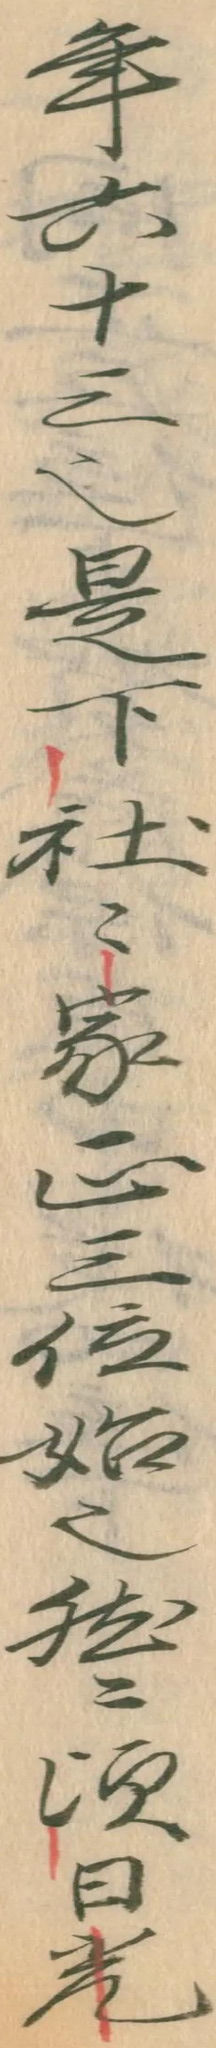年六十三也是下_社々-家正三位始也然ニ頃_日光
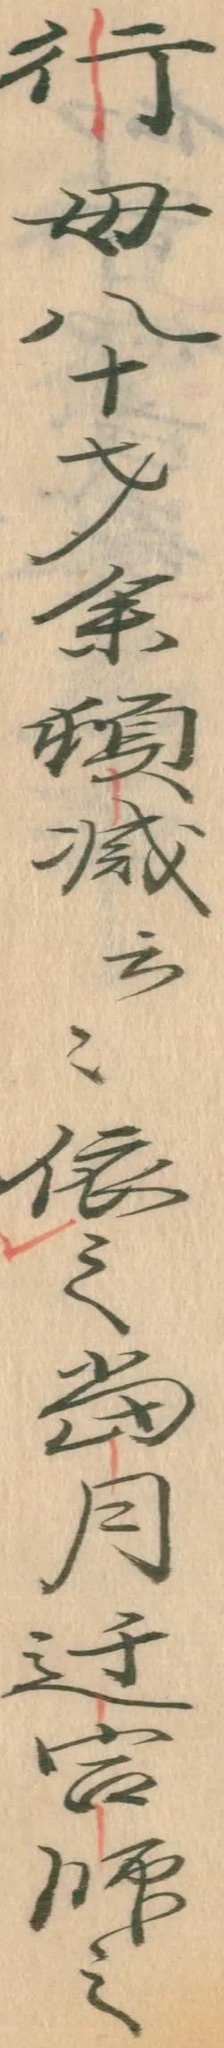行母八十才余頓-滅云々依之当-月迁-宮-師之
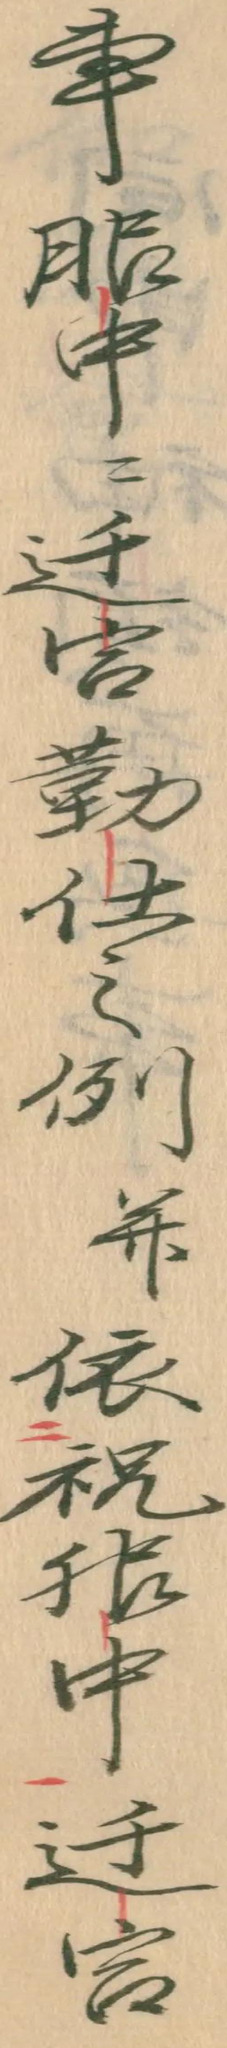事服-中ニ迁-宮勤-仕之例并依祝服-中迁-宮
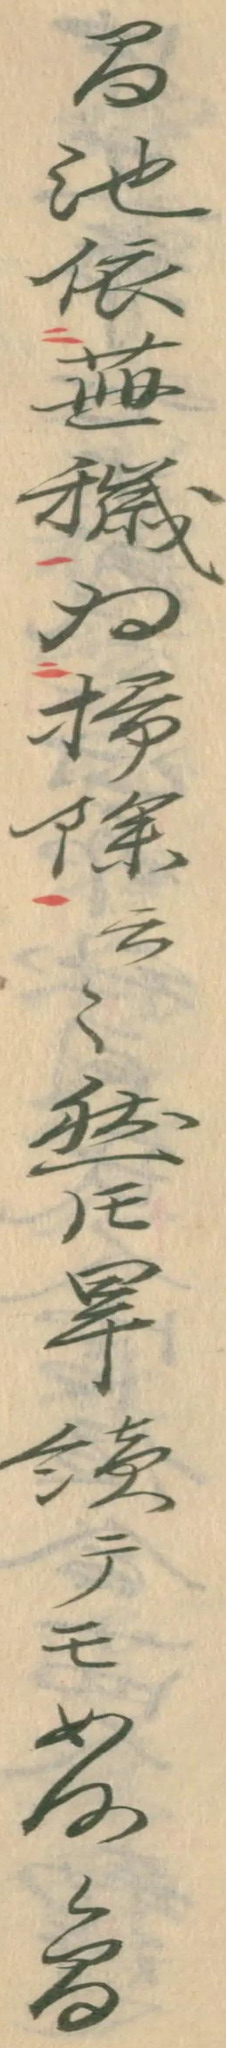間池依蕪穢為掃除云々然トモ旱続テモ如何候間

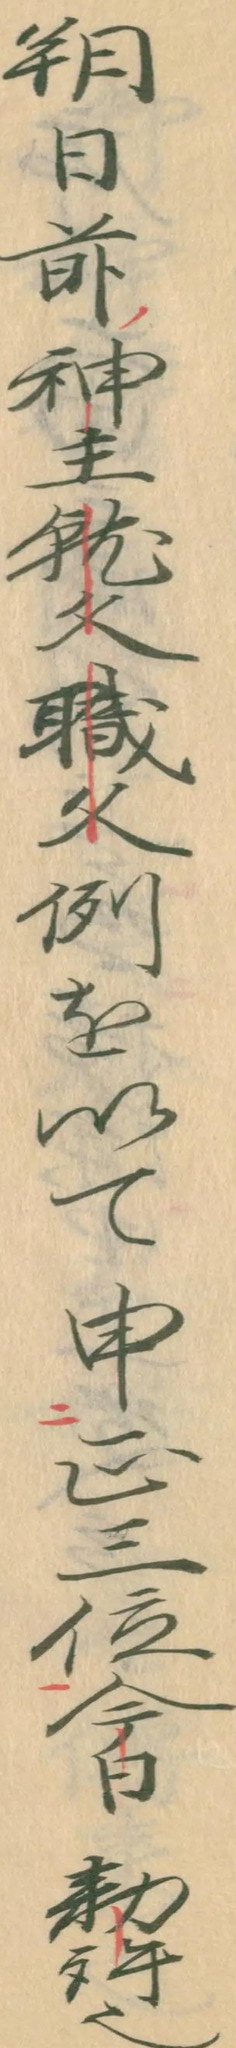朔日前神-主就久職久例を以て申正三位今-日勅-許也
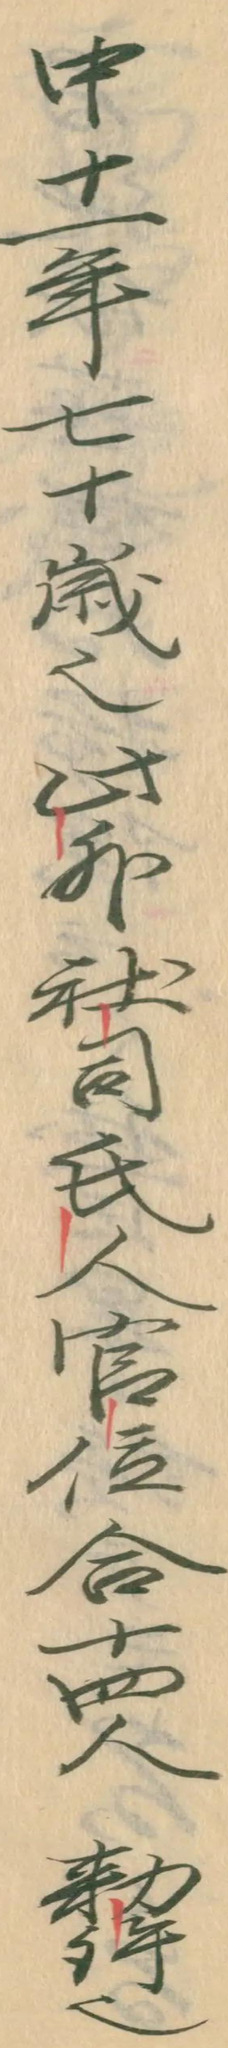中十一年七十歳也此_外社-司氏官-位合十四人勅-許也
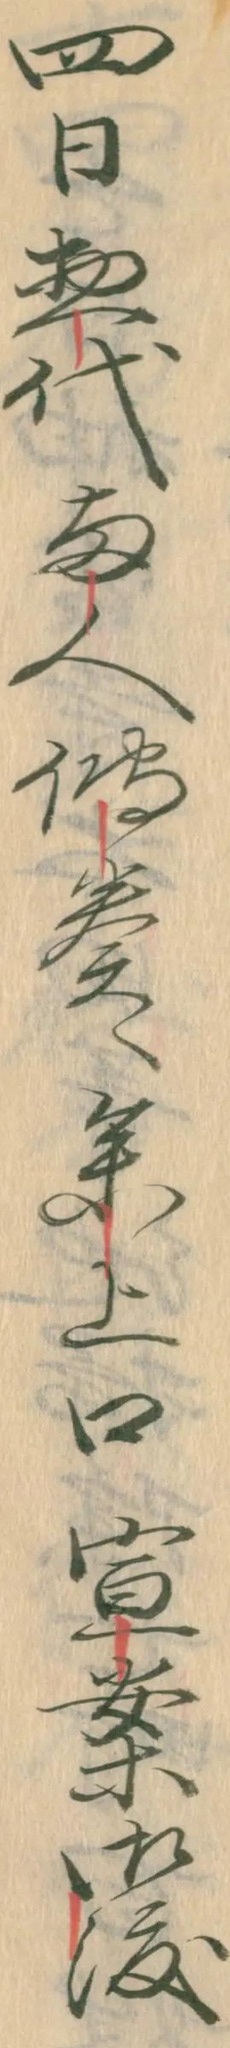四日惣-代両-人伝-奏へ参-上口宣-案御_渡
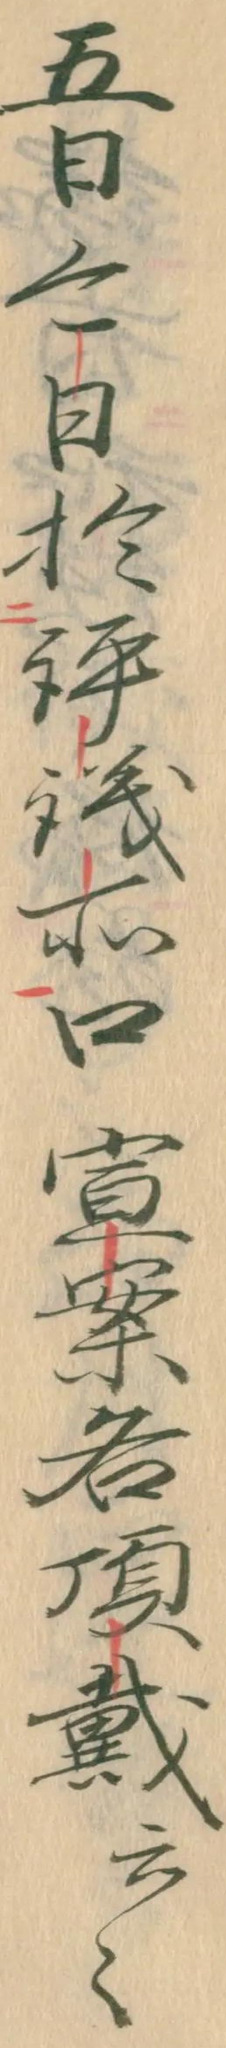五日今-日於評-議-所口宣-案各頂-戴云々
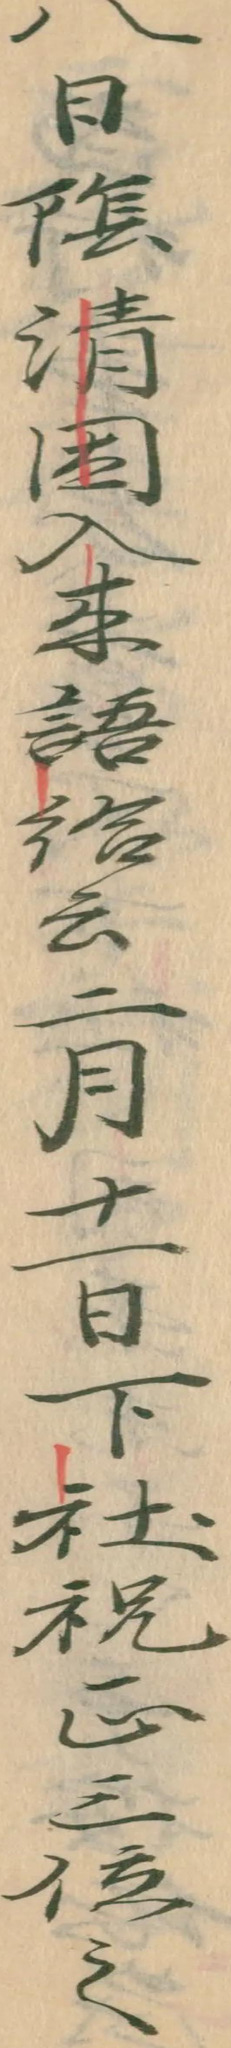八日陰清因入-来語_給云二月十一日下_社祝正三位之
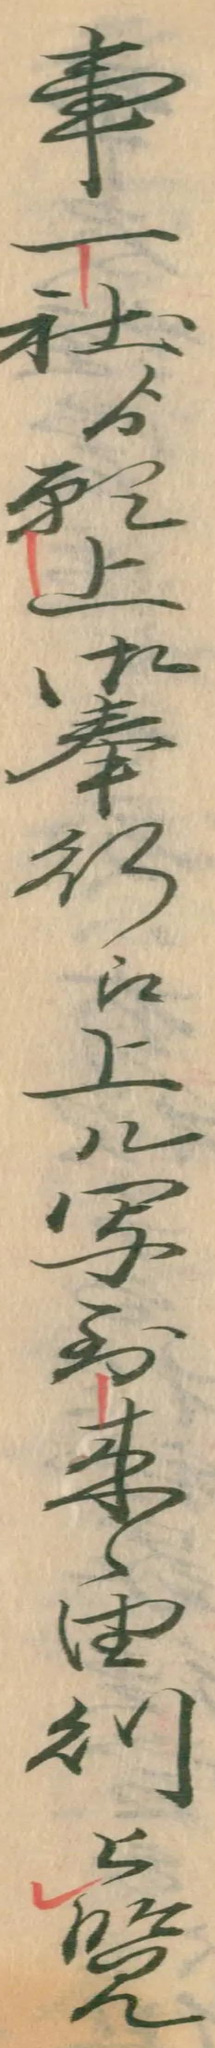事一-社ゟ願御奉行江上ル写到-来候由則被覧
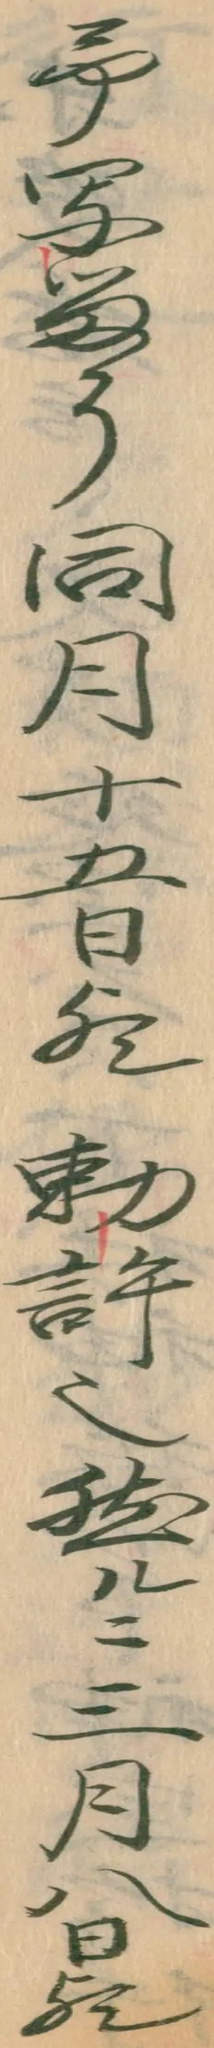予写_留了同月十五日歟勅-許也然ルニ三月八日歟
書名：賀茂社記録. 第16冊
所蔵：国立国会図書館 National Diet Library, JAPAN
